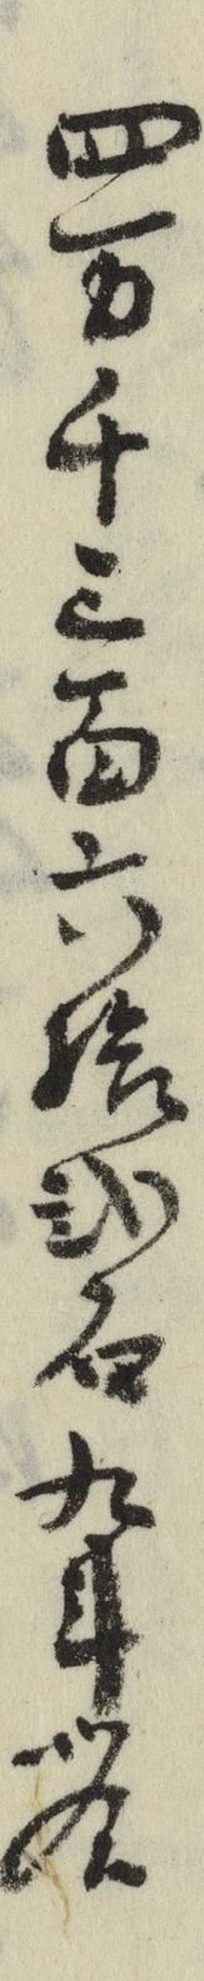四万千三百六拾弐石九斗弐合弐夕
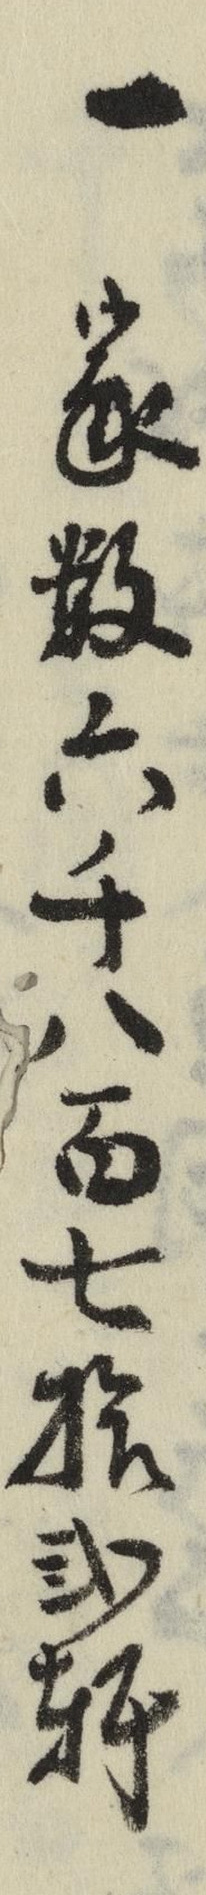一家数六千八百七拾弐軒
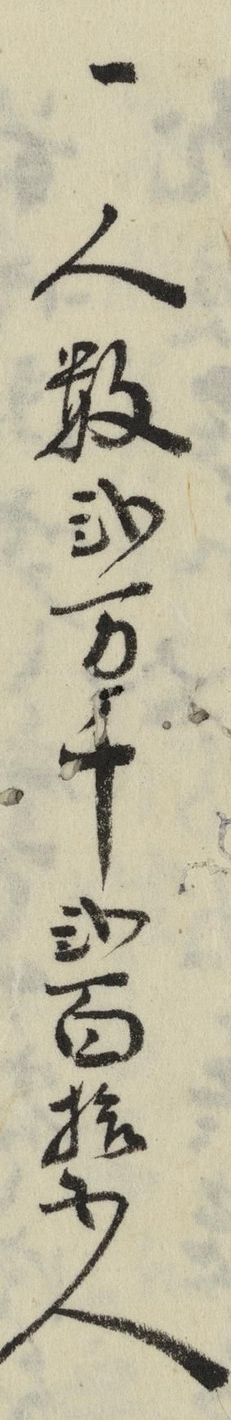一人数弐万千弐百拾五人
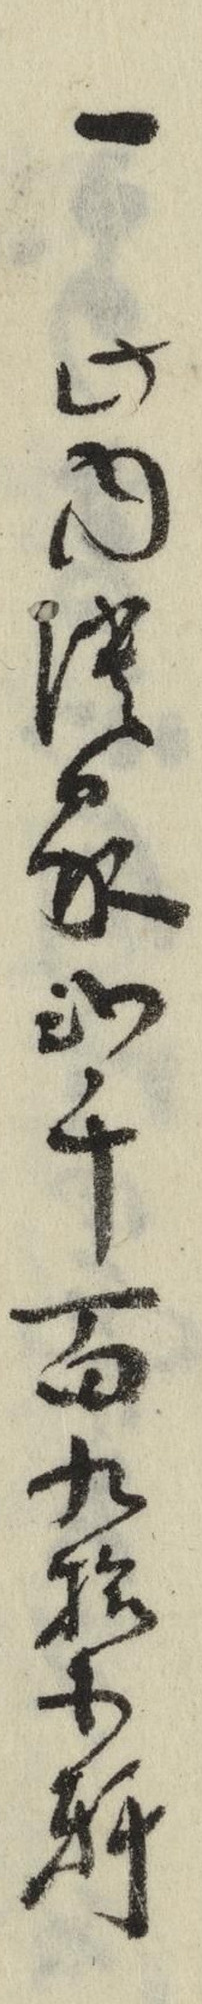一此内潰家弐千百九拾五軒
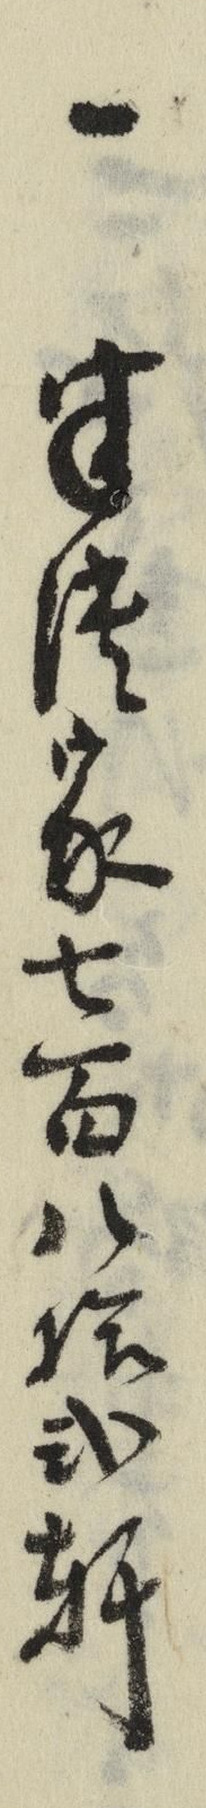一半潰家七百八拾弐軒

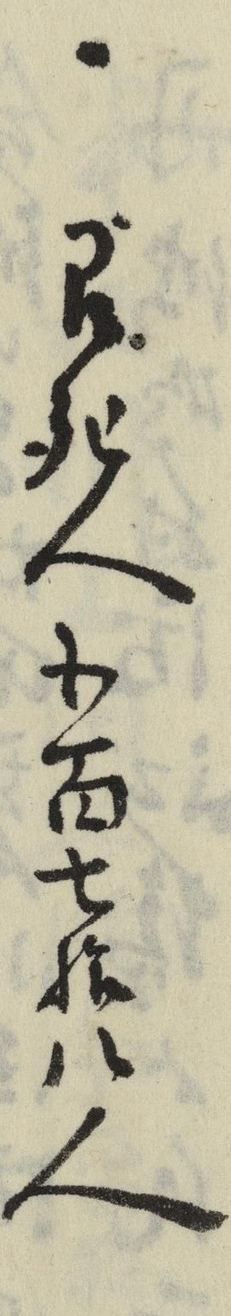一即死人五百七拾八人
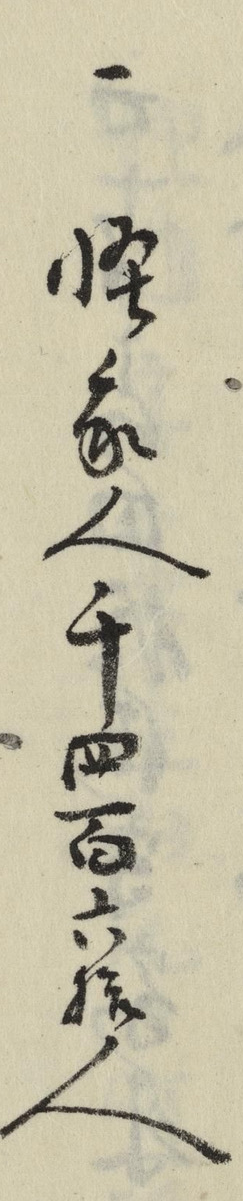一怪我人千四百六拾人
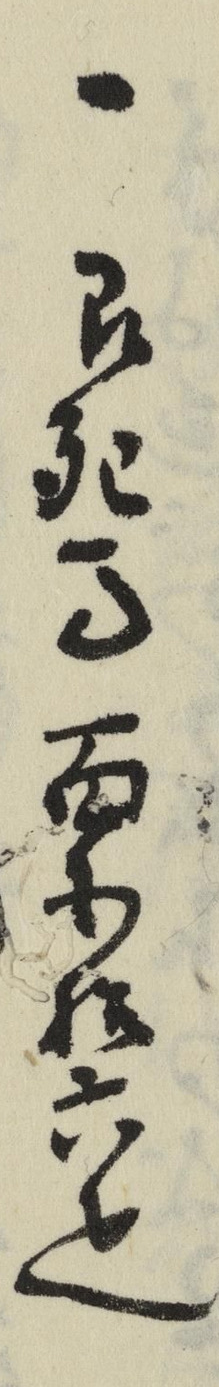一即死馬百五拾六疋
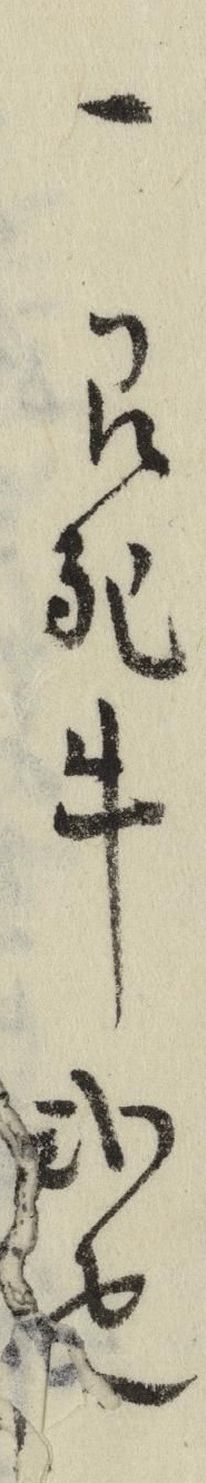一即死牛弐疋
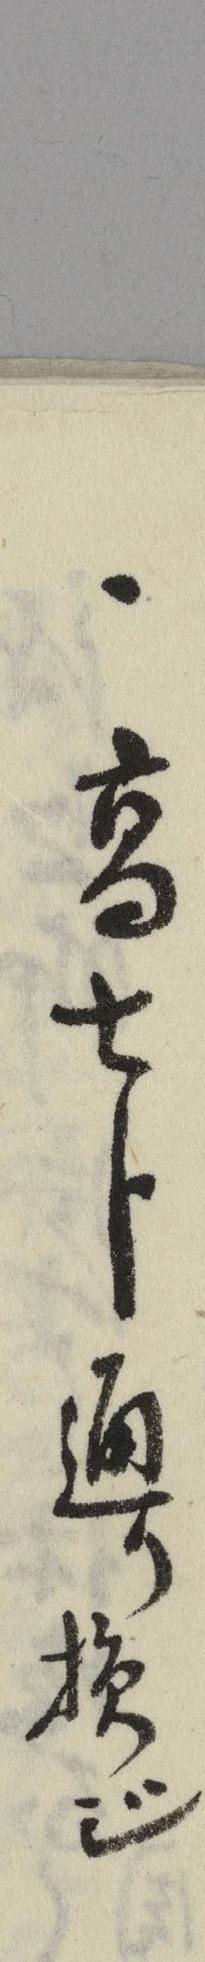一高七分通リ損ジ
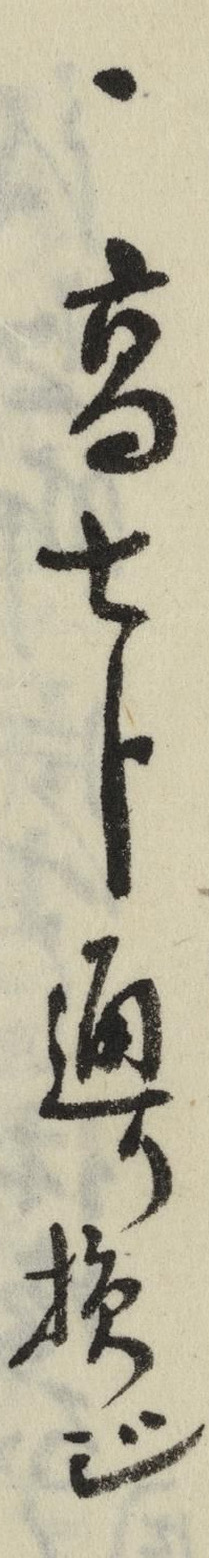一高七分通リ損ジ
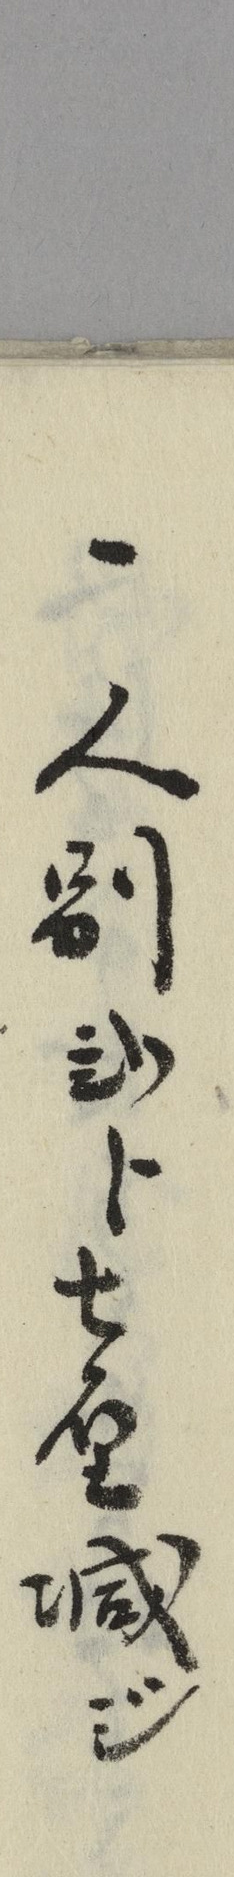一人別弐分七厘減ジ
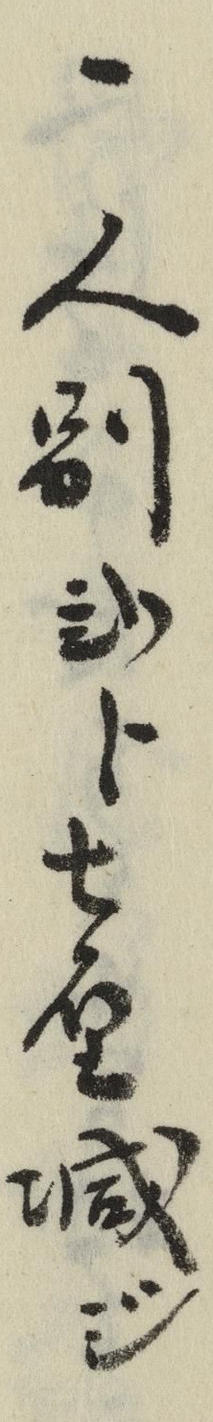一人別弐分七厘減ジ
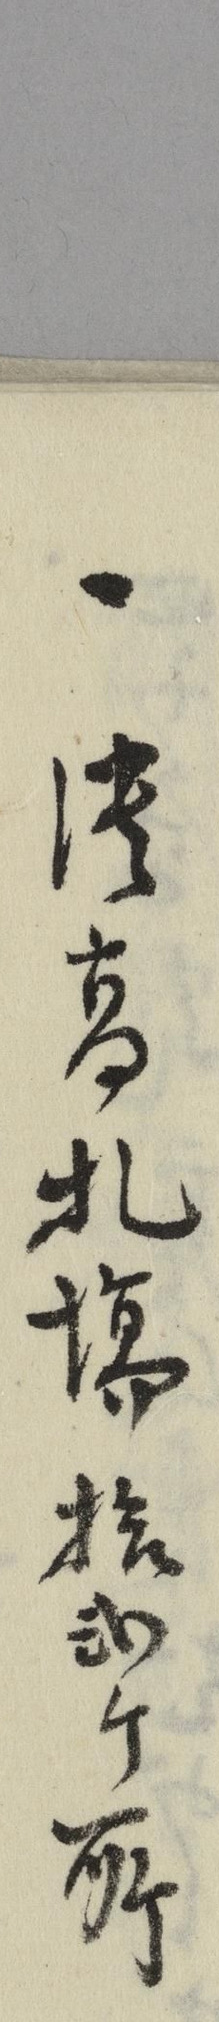一潰高札場拾弐ヶ所
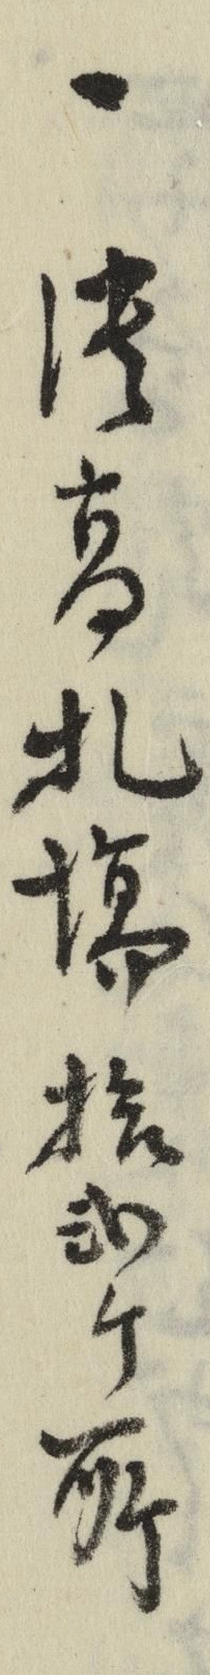一潰高札場拾弐ヶ所
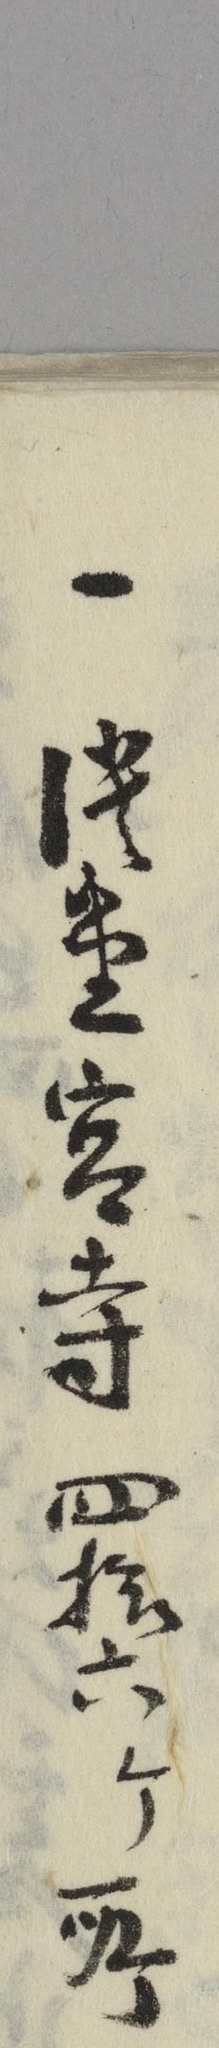一潰堂宮寺四拾六ヶ所
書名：信州大地震一件之冩　丁未弘化四年三月吉日
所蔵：東京大学地震研究所図書室 Earthquake Research Institute Library, The University of Tokyo, JAPAN
